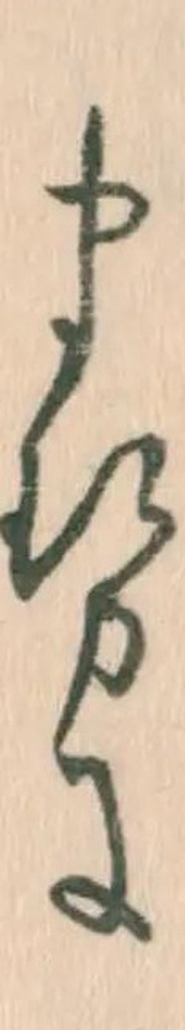まぜに
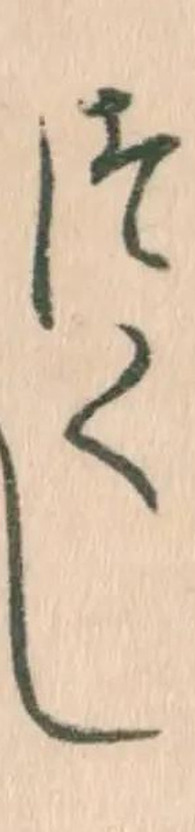つくし
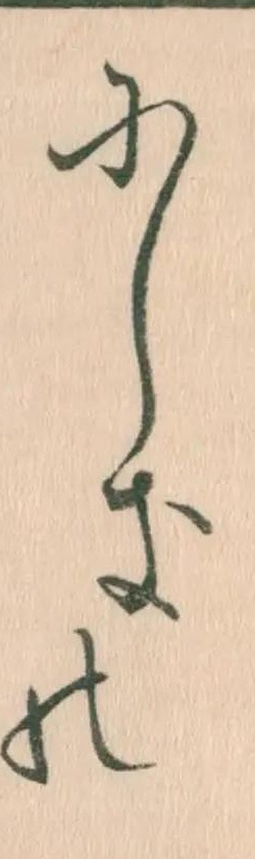にしきの
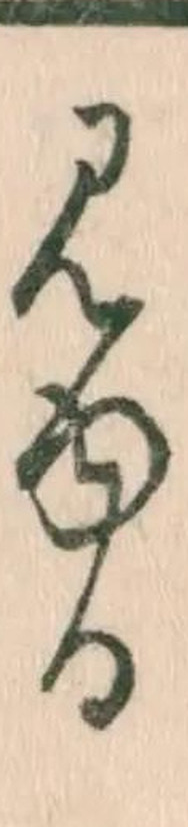見ゆる
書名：貝盡浦之錦 2巻. [1]
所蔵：国立国会図書館 National Diet Library, JAPAN
